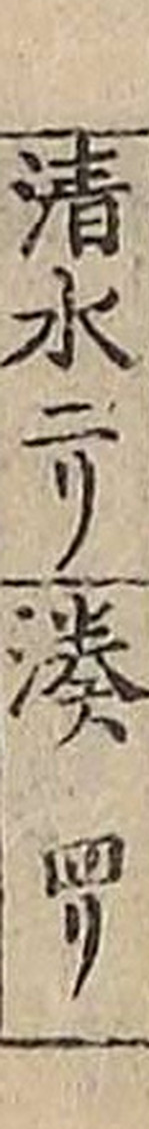野水二リ
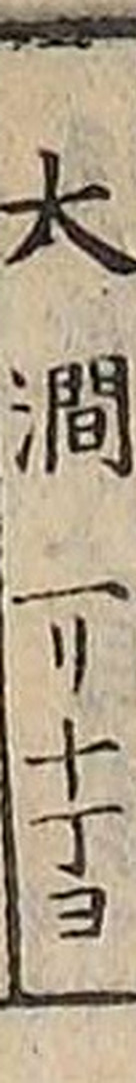大澗一リ十丁ヨ
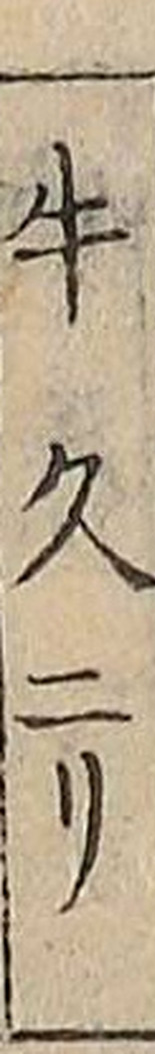牛久二リ
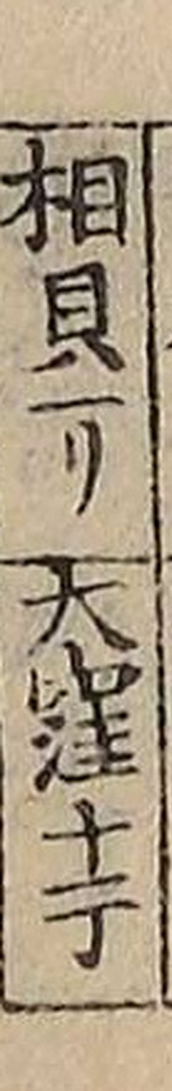相貝一リ大窪十一丁
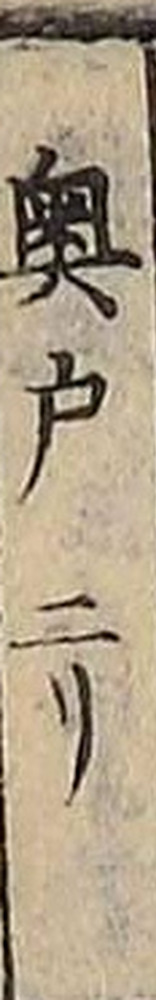奥戸二リ
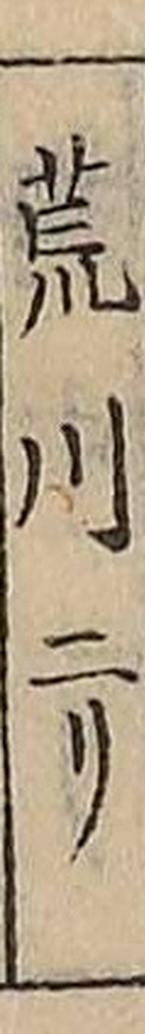荒川二リ
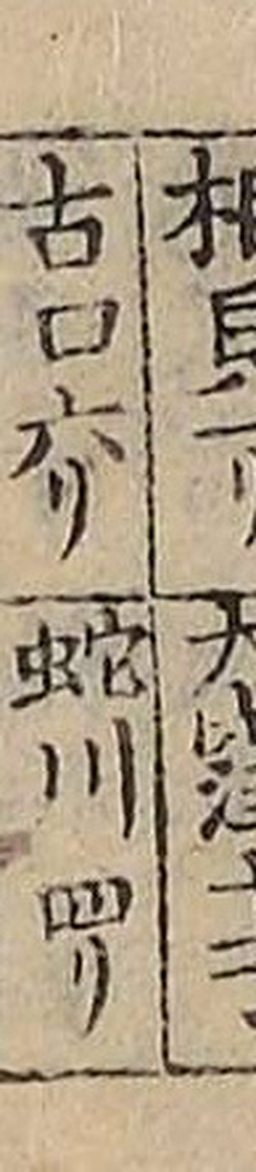古口六リ蛇川四リ
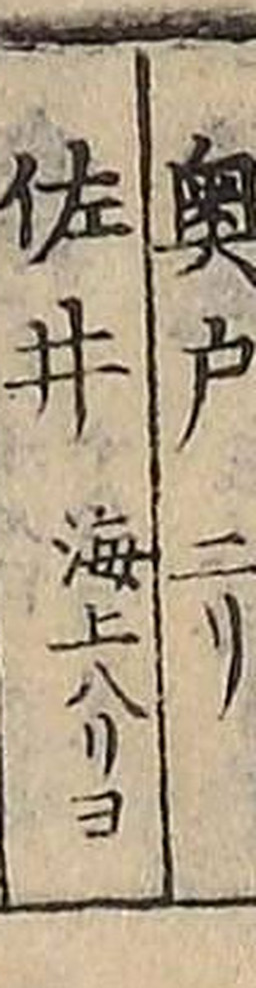佐井海上八リヨ
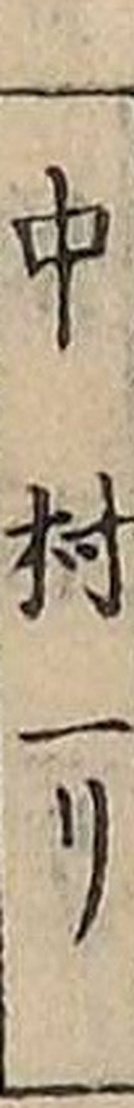中村一リ
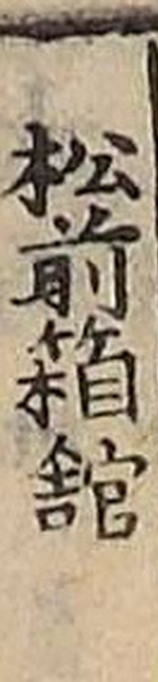松前箱館
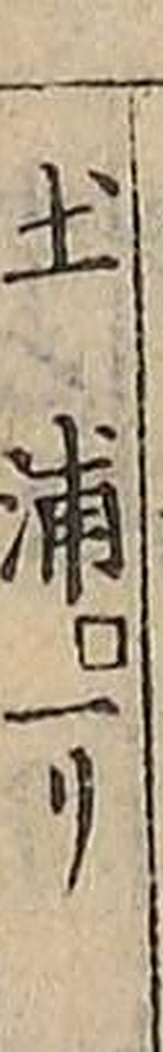土浦▫一リ
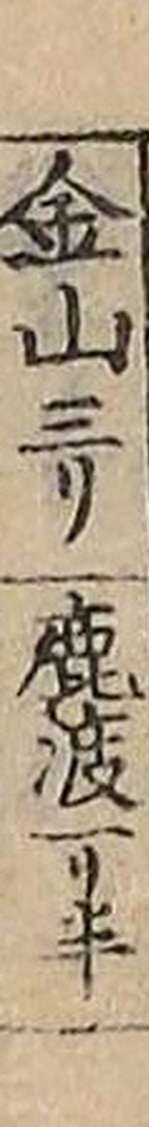金山三リ鹿渡一リ半
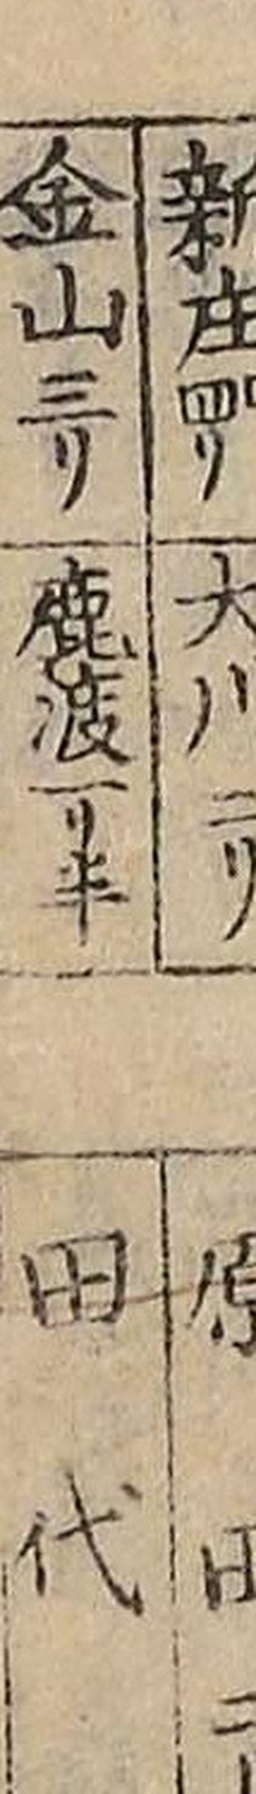金山三リ鹿渡一リ半

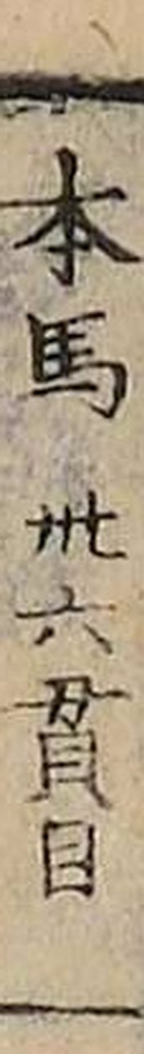本馬卅六貫目
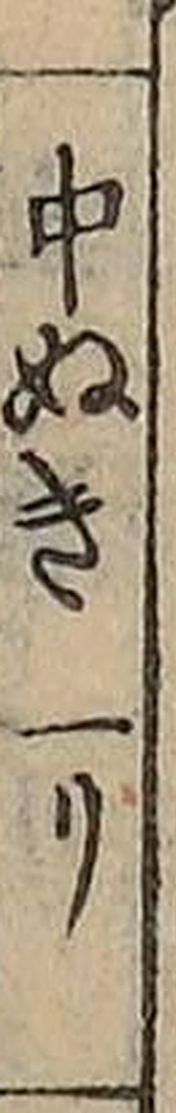中ぬき一リ
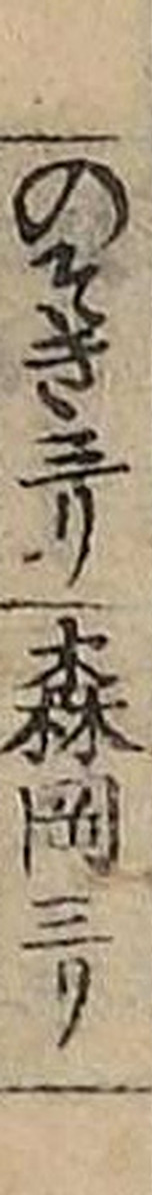のそき三リ森岡三リ
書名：旅行用心集
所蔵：神戸大学附属図書館 国文学研究資料館
